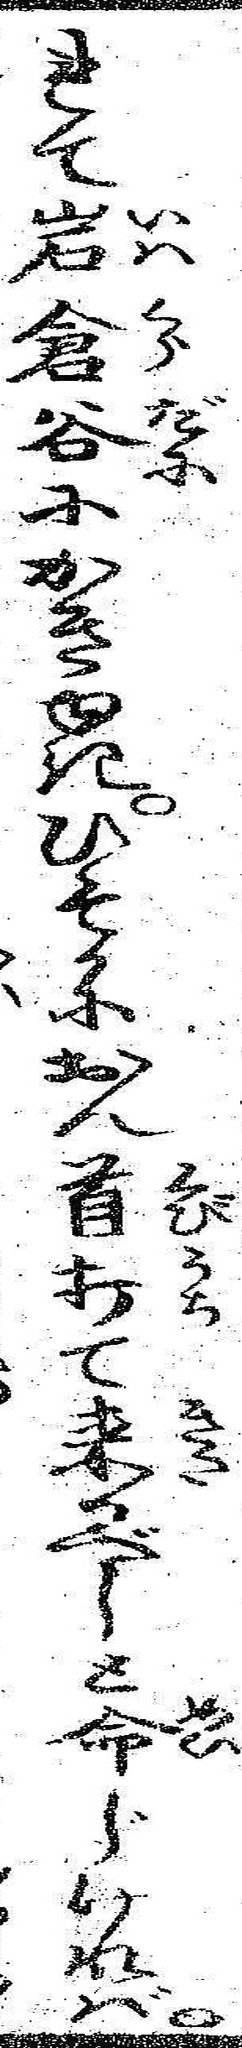れて岩倉谷にかきゆき。ひそかにおん首打て来るべしと命じければ。
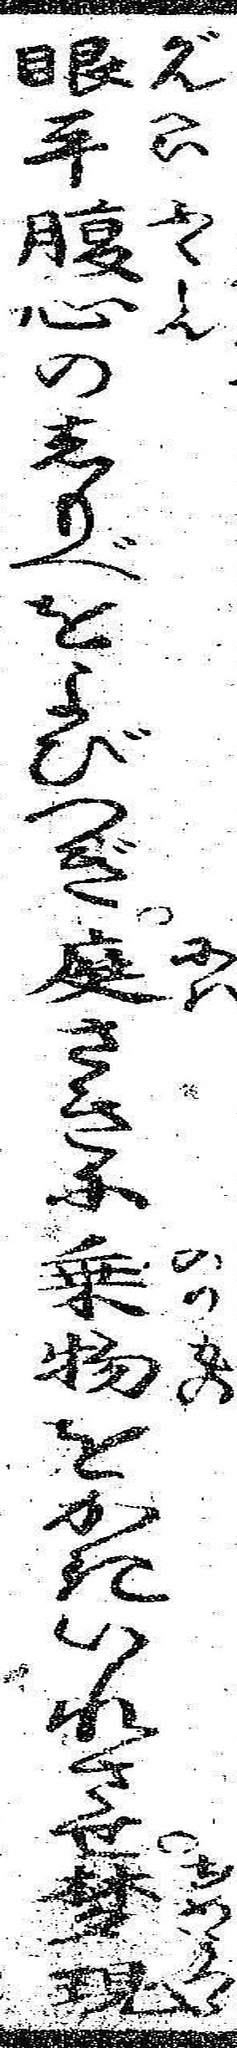眼平腹心のしもべをよびつぎ。庭さきに乗物をかきいれさせ。夢現
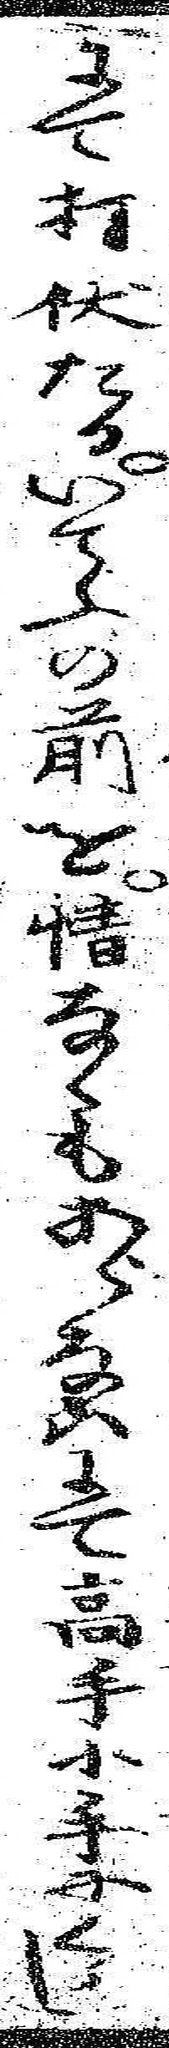にて打伏たる。いてふの前を。情なくもあらなはにて高手小手にくゝし
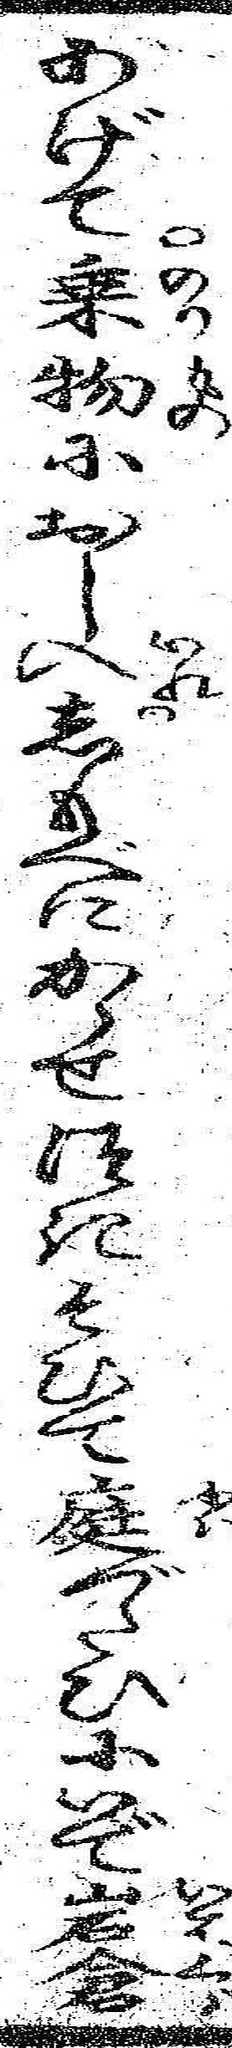あげて。乗物におし入。しもべにかゝせつきそひて庭づたひにいで岩倉

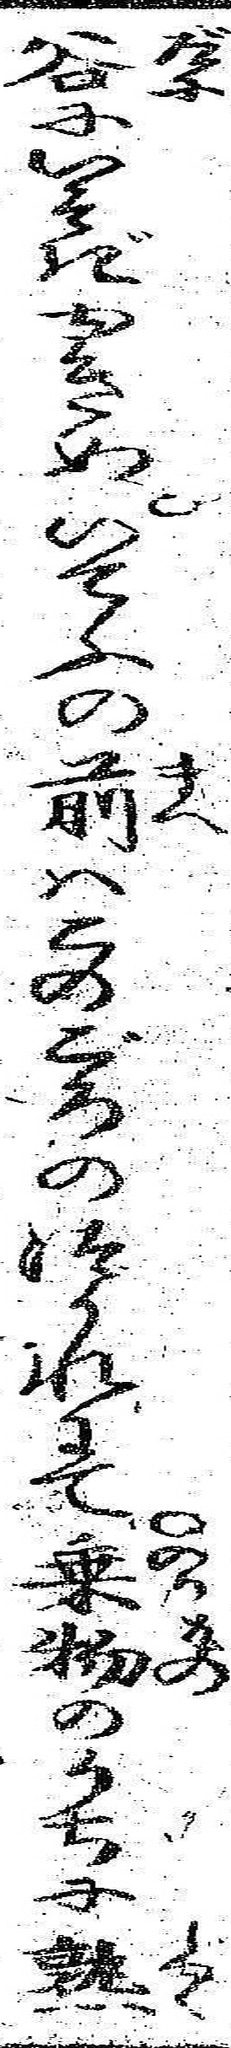谷にいそぎゆきぬ。いてふの前はこのごろのつかれにて。乗物のうちに熟
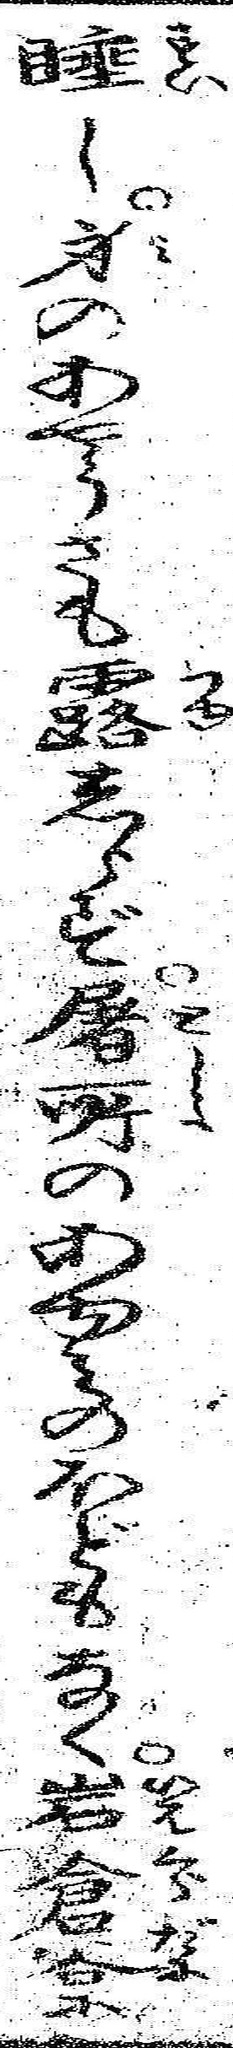睡し。身のあやうさも露しらず。屠所のあゆみのほどもなく。岩倉谷に
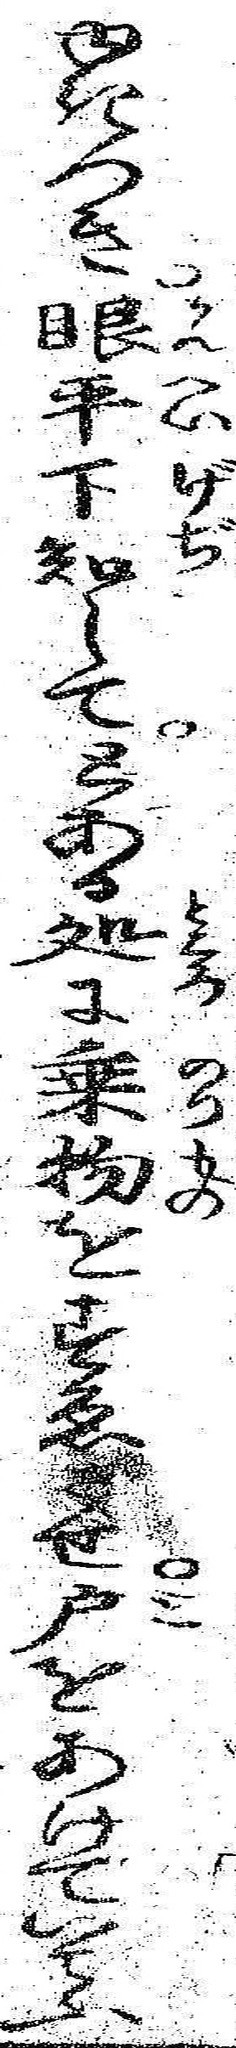ゆきつき。眼平下知して。とある処に乗物をすゑさせ。戸をあけていてふ
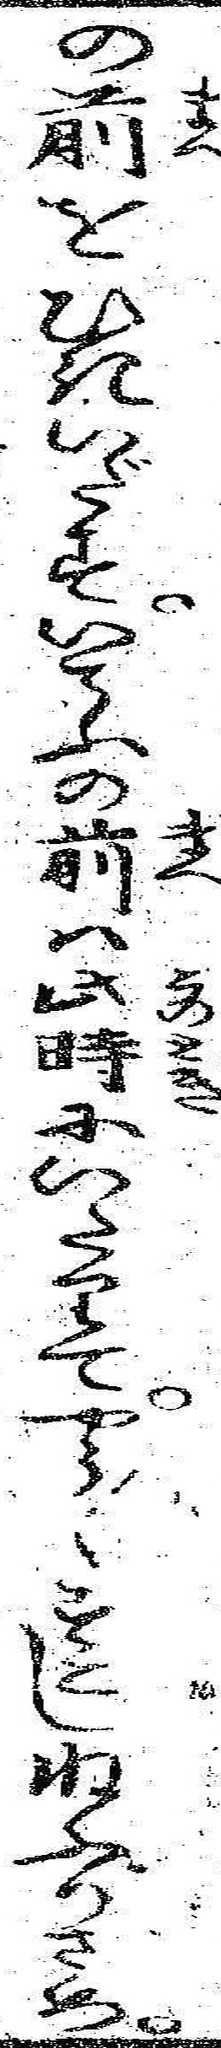の前をひきいだす。いてふの前は此時にいたりて。やう〳〵すこしねふりさめ。
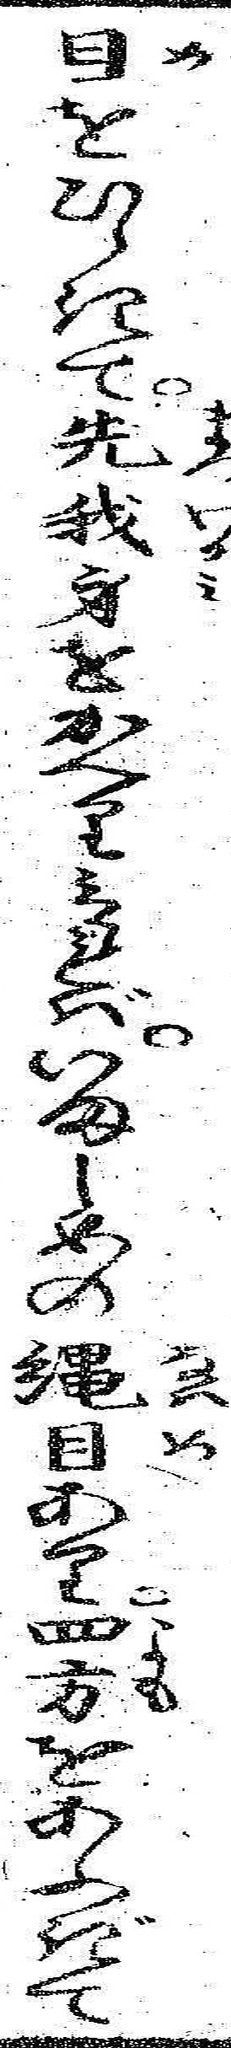目をひらきて。先我身をかへりみれば。いましめの縄目あり。四方をあふぎて
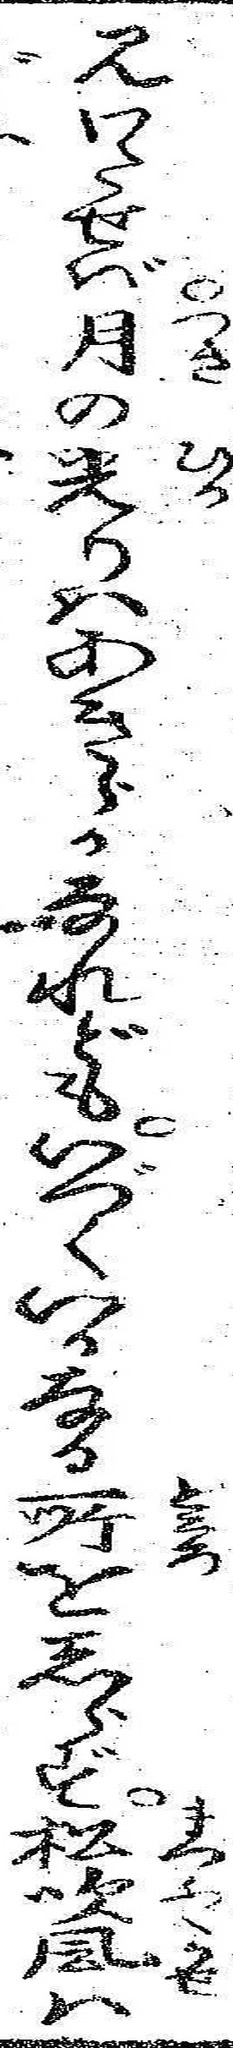見わたせば。月の光りはあきらかなれども。いづくいるなる所をしらず。松吹風は
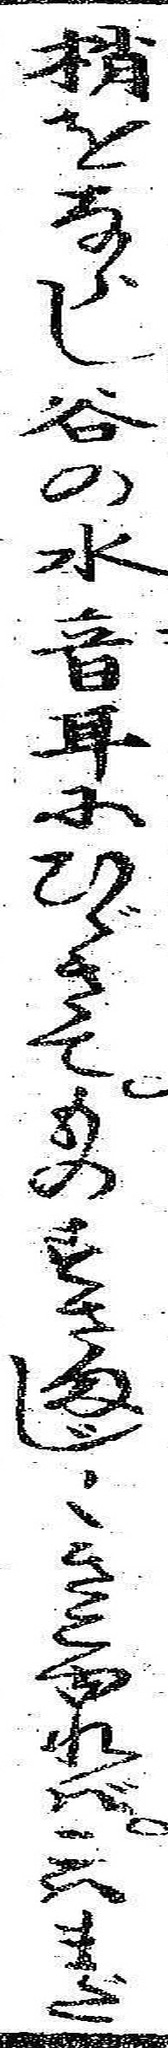梢をならし。谷の水音耳にひゞきて。ものすさまじくきこゆれば。こはまだ
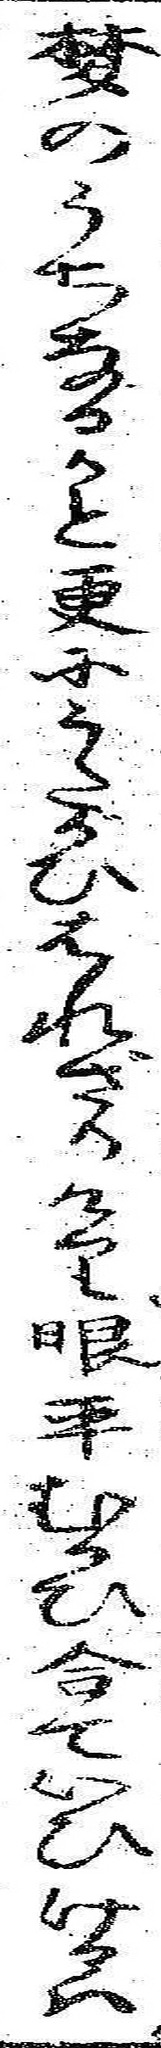夢のうちなるかと。更にうたがひはれざりけり。眼平むかひ合ていひけるは。
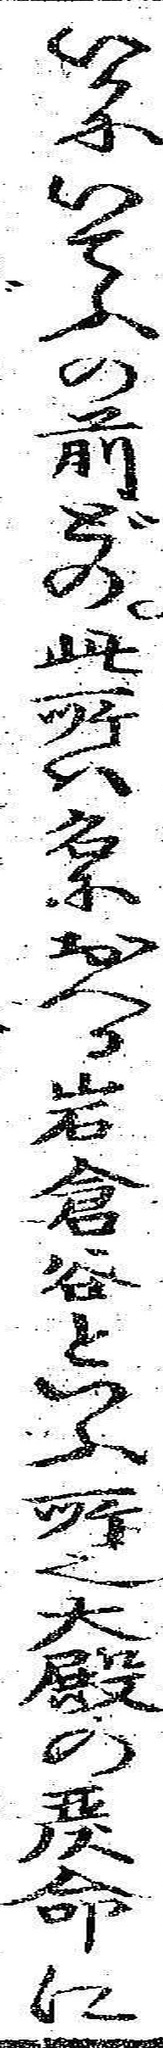いかにいてふの前どの。此所は名におへる岩倉谷といふ所也。大殿の厳命に
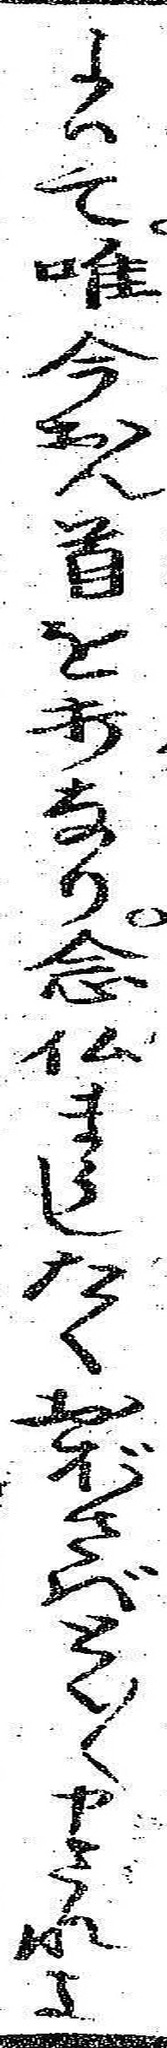よりて。唯今おん首を打なり。念仏まうしたくおぼさばとく〳〵申されよ
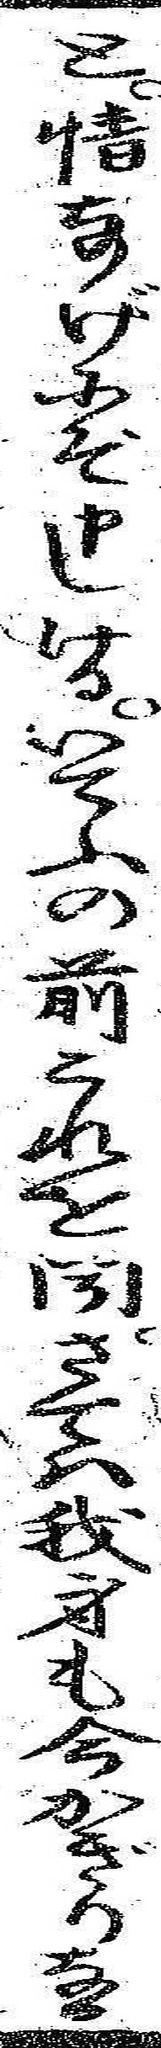と。情なげにぞ申しける。いてふの前これを聞。さては我身も今かぎりなる
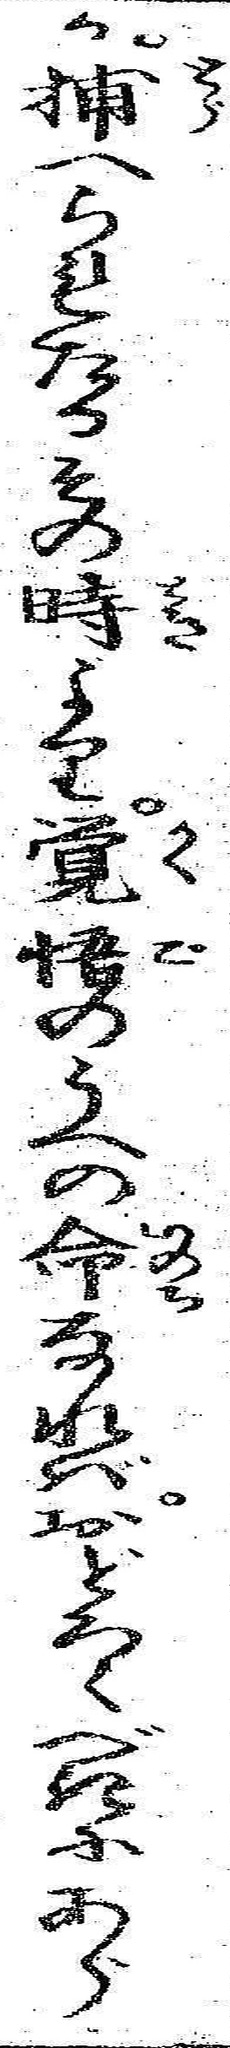か。捕へられたるその時より。覚悟のうへの命なれば。おどろくべきにあら
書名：昔話稲妻表紙
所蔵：国文学研究資料館
